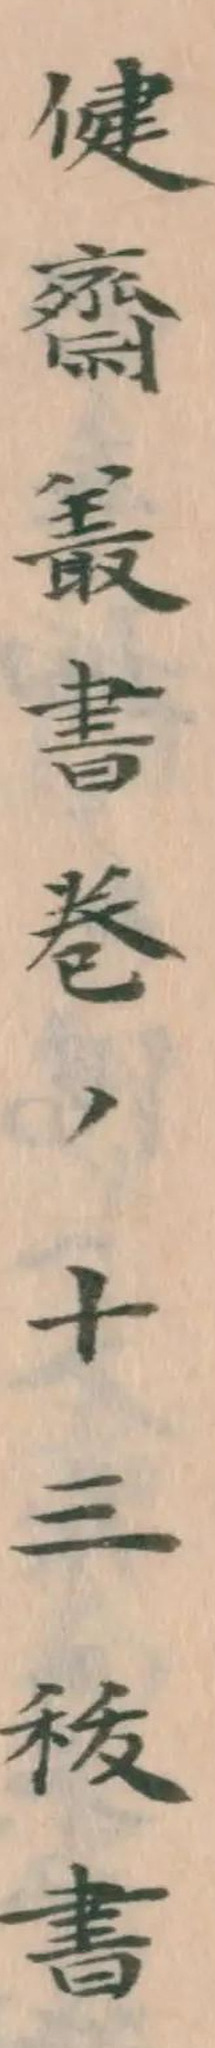健齋叢書巻ノ十三抜書
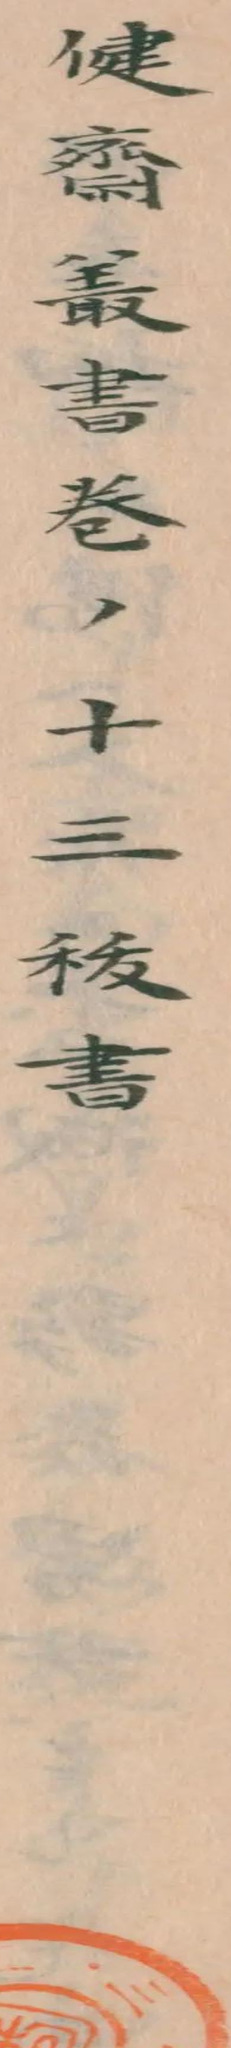健齋叢書巻ノ十三抜書
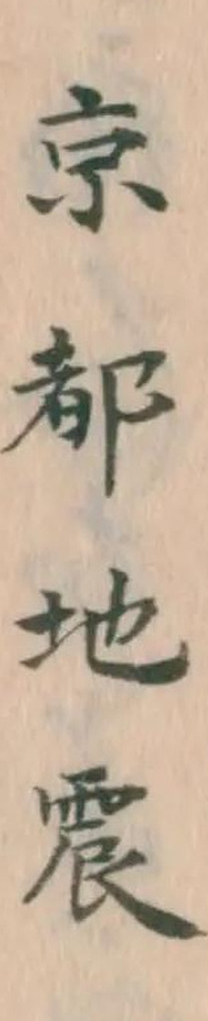京都地震
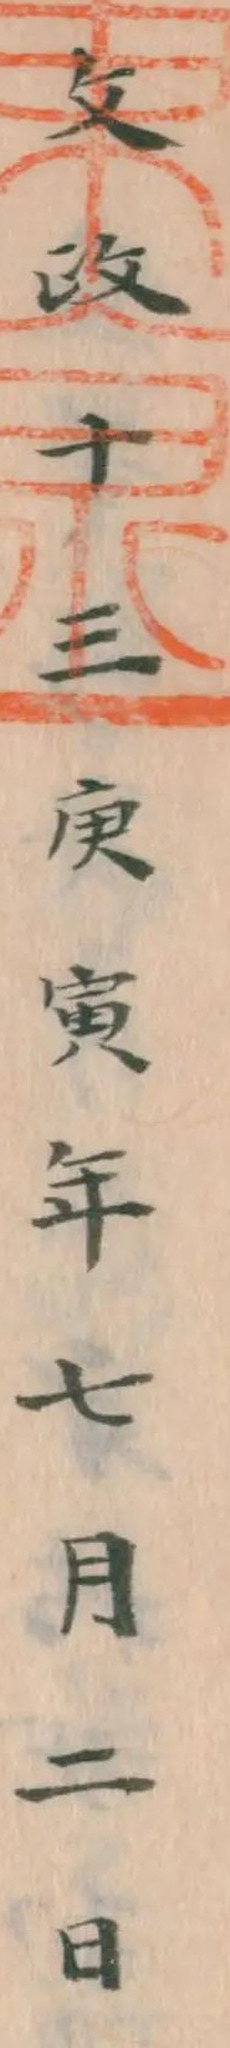文政十三庚寅年七月二日
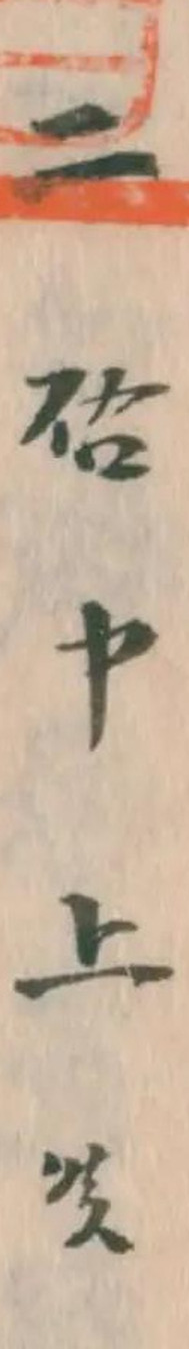二啓申上候
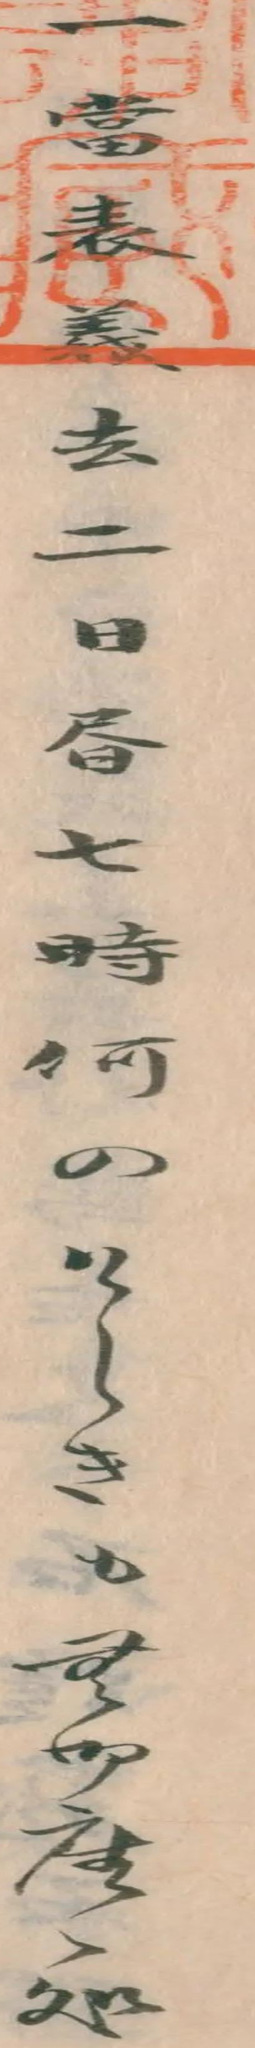一當表義去二日昼七時何のけしきも無御座候処
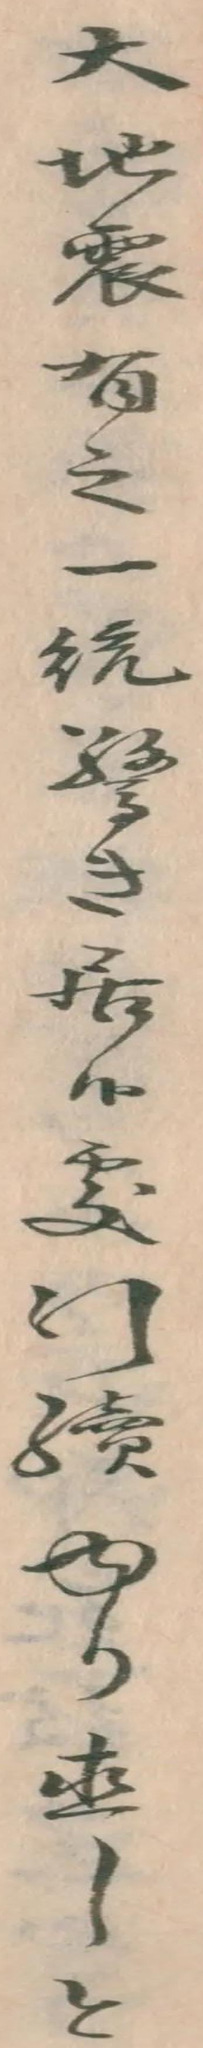大地震有之一統驚き居候処引續ゆり直しと
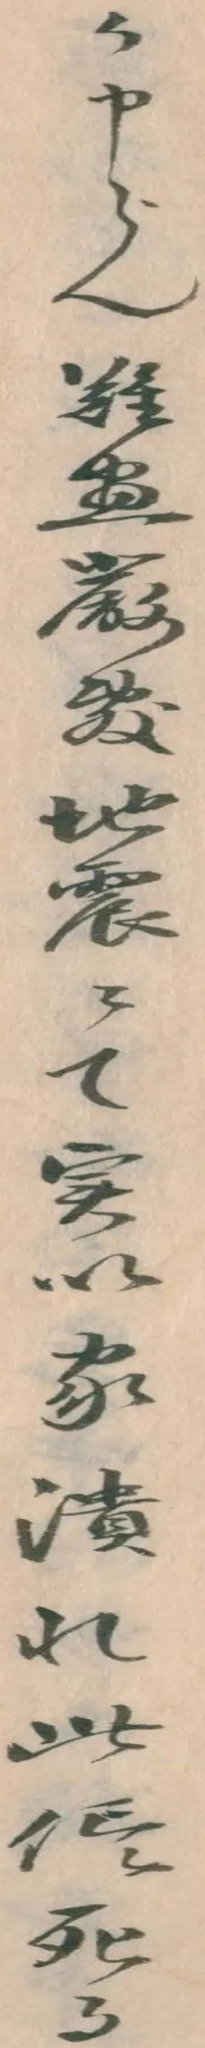か申らん難尽厳敷地震にて実以家潰れ此侭死る
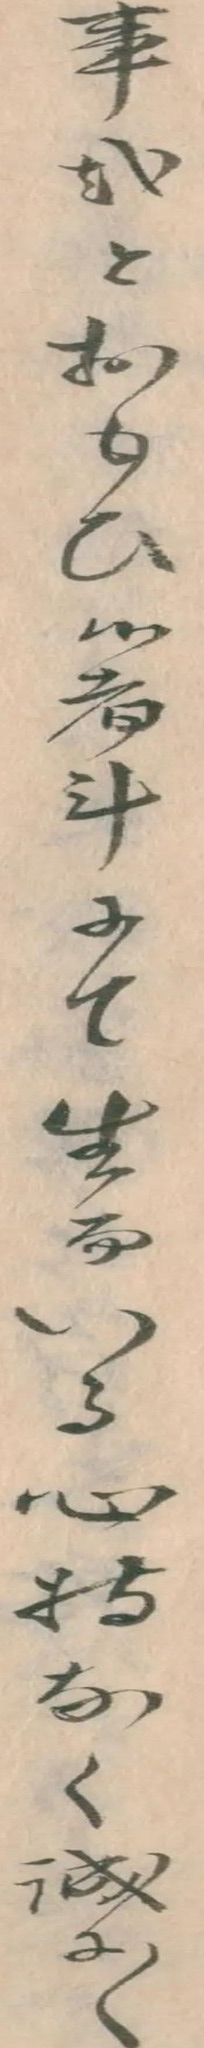事哉とおもひ候者斗にて生ている心持なく誠に〳〵
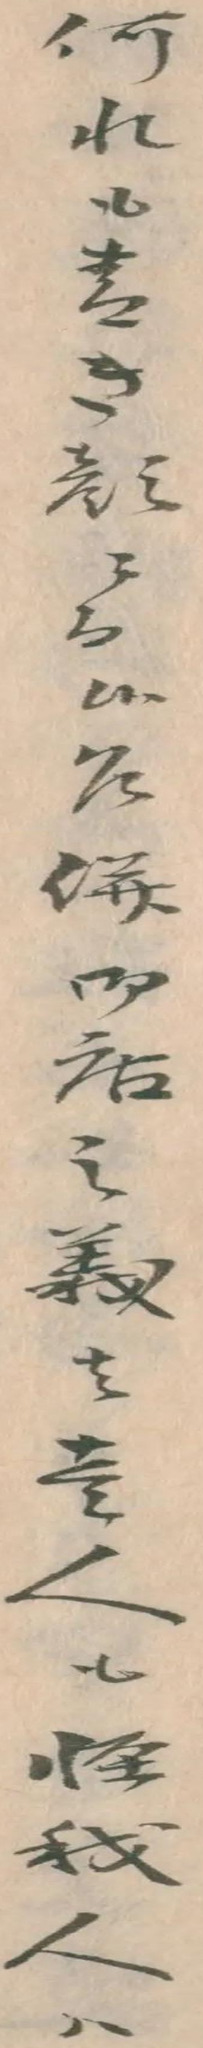何れも青き顔にて候乍併御店之義は壱人も怪我人は
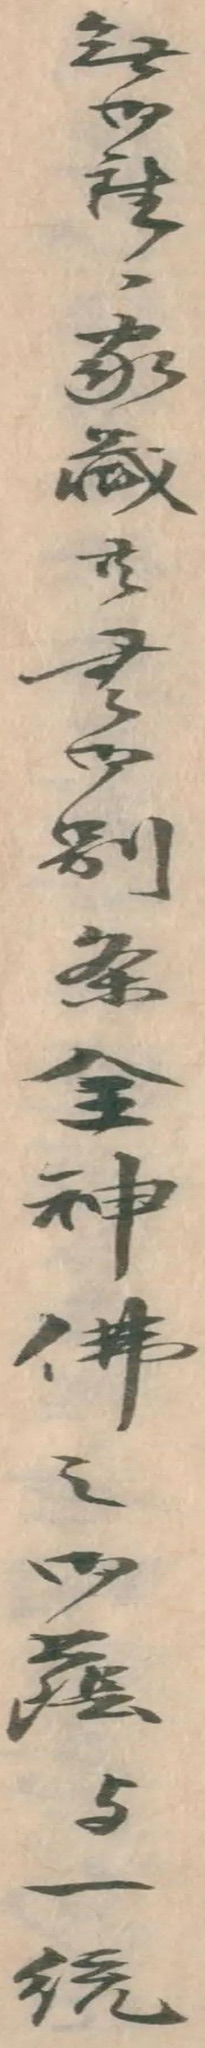無御座候家蔵共無御別条全神仏の御蔭と一統

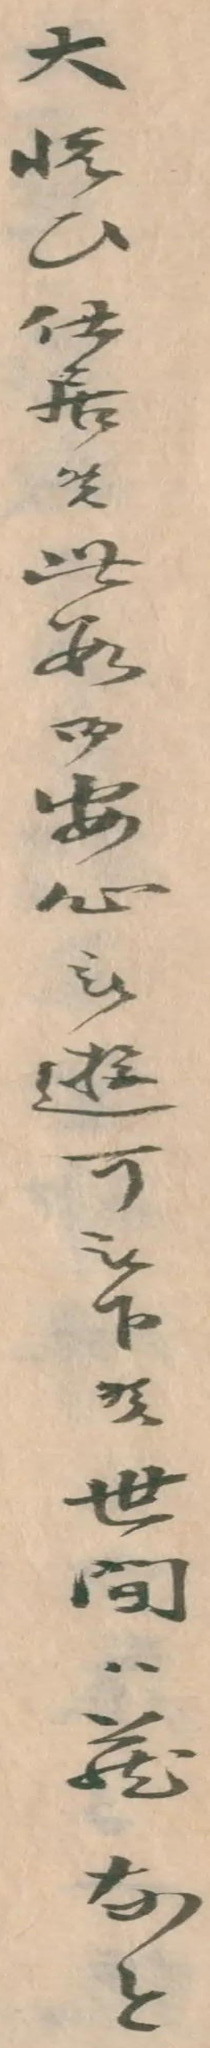大悦ひ仕居候此段御安心被遊可被下候世間は蔵なと
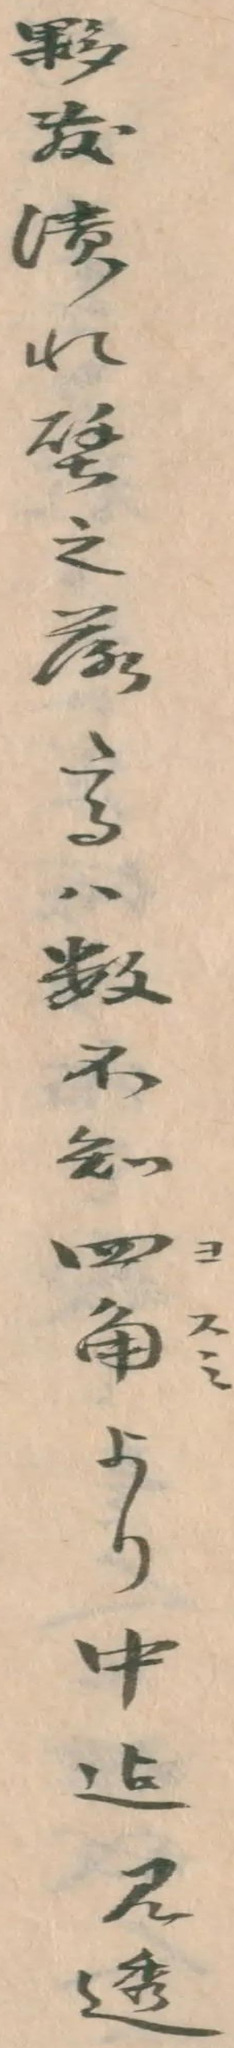夥敷潰れ壁の落たるは数不知四角より中迄見透
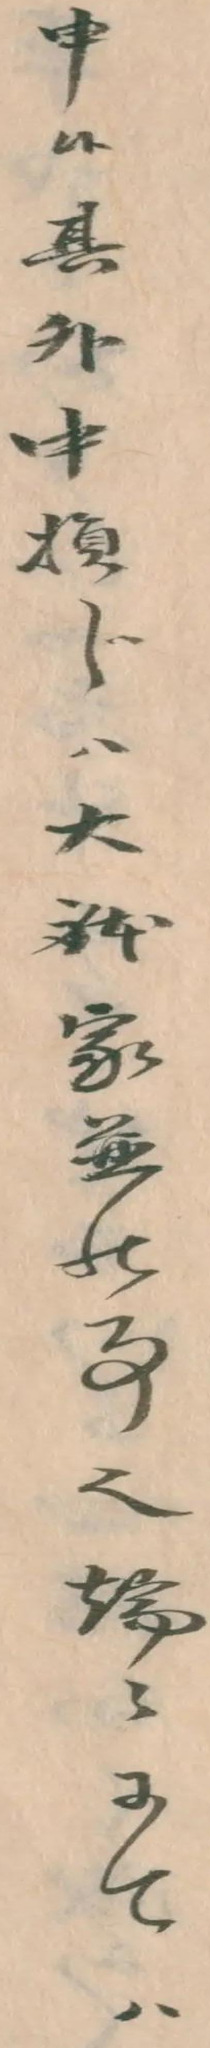申候其外中損じは大体家並の事也端々にては
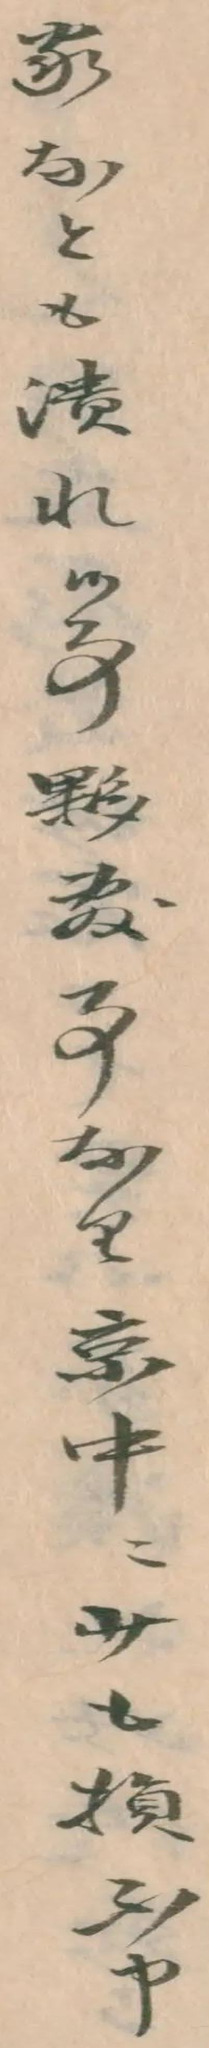家なとも潰れ候事夥敷事なり京中に少も損不申
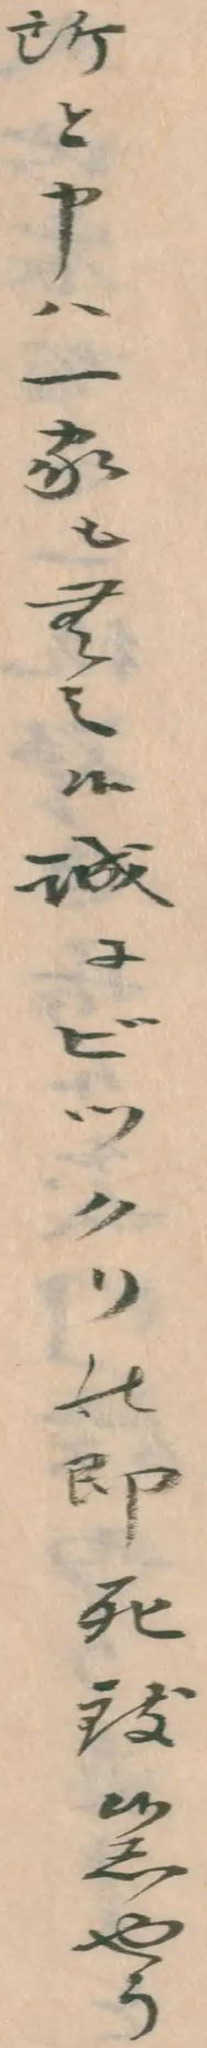所と申は一家も無之候誠にビツクリの即死致候しやう
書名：京都地震
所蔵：国立国会図書館 National Diet Library, JAPAN
